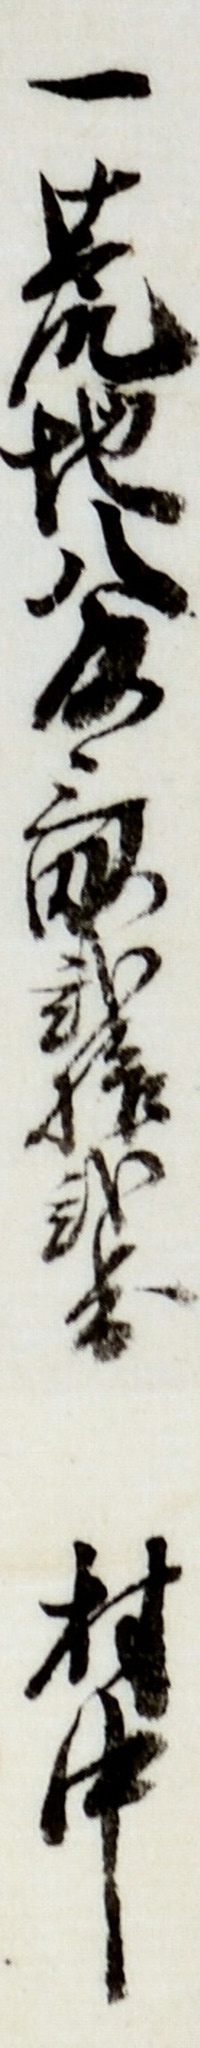一荒地八反三畝弐拾弐歩村中

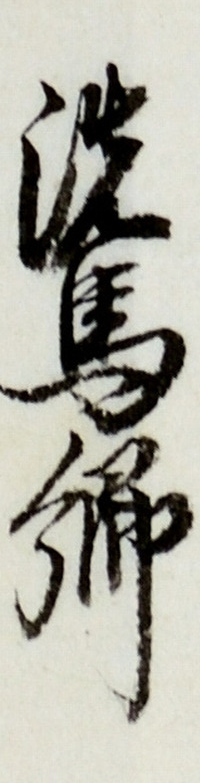洗馬郷
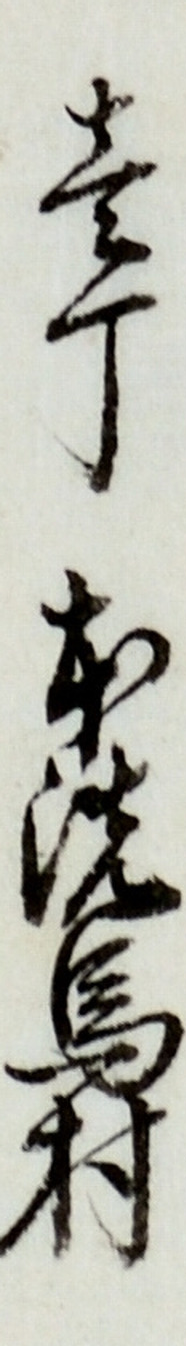壱丁本洗馬村
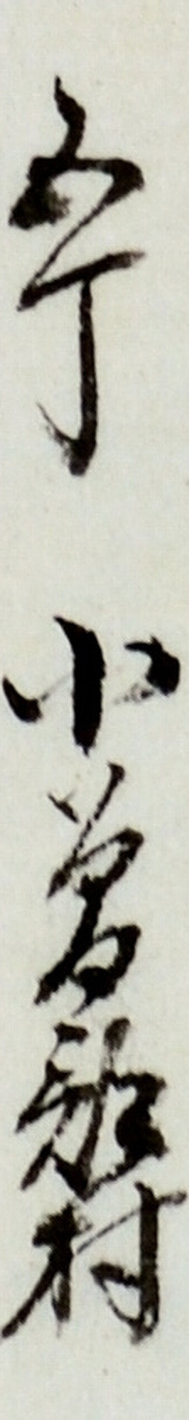五丁小曾部村
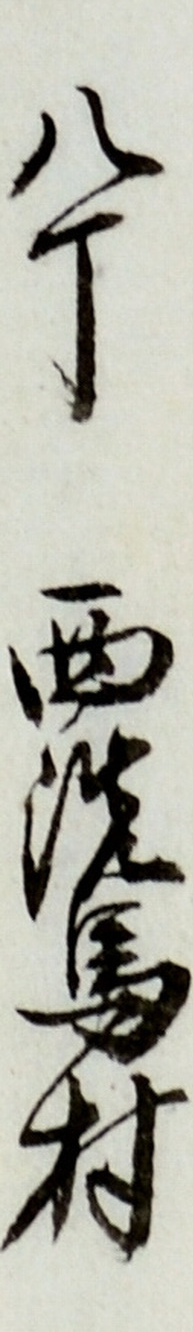八丁西洗馬村
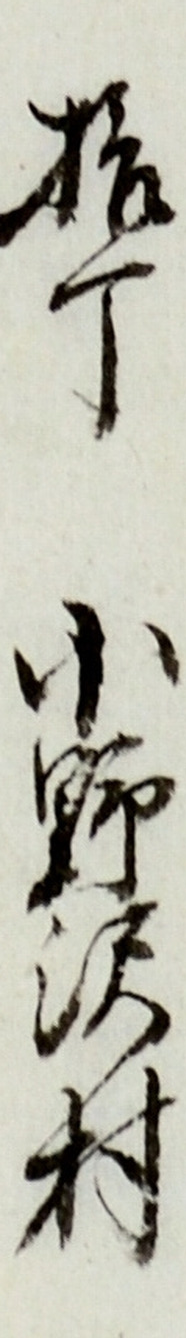拾丁小野沢村
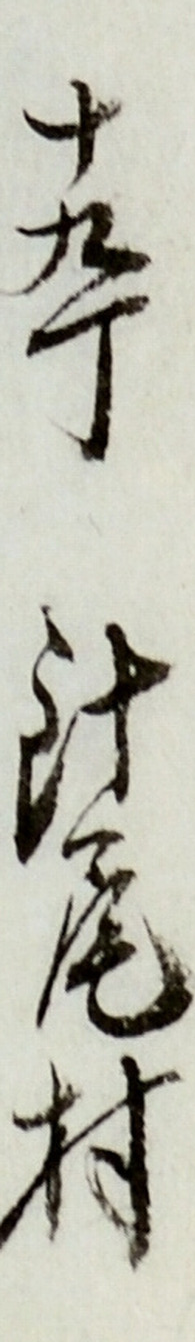十九丁針尾村
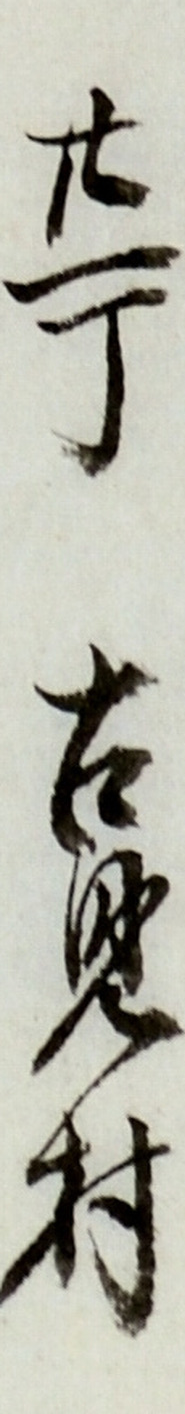廿一丁古見村
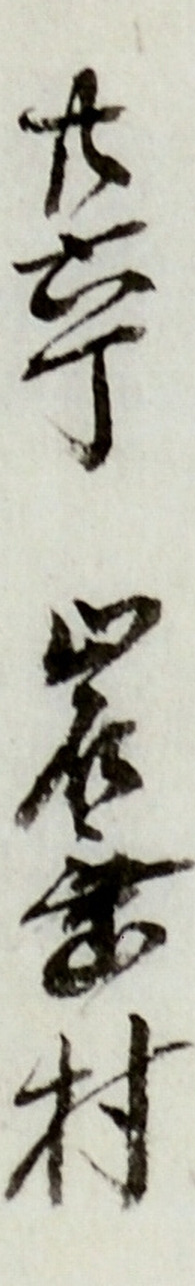廿六丁岩垂村

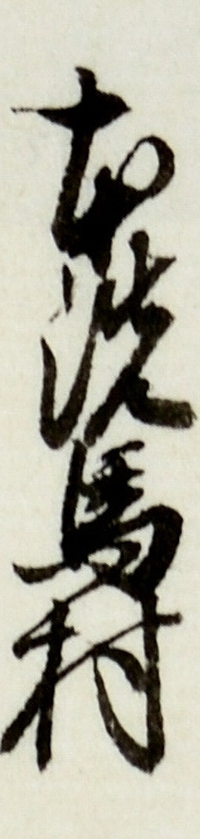本洗馬村
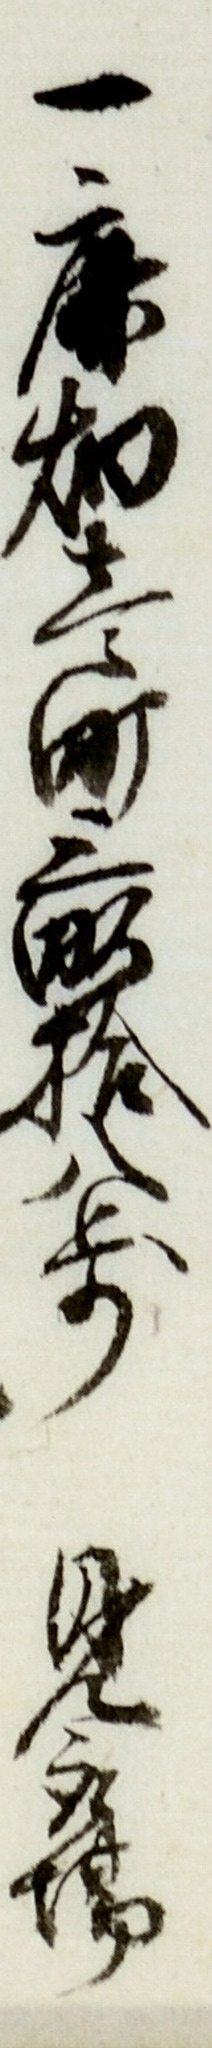一麻畑壱町三畝拾八歩見取場
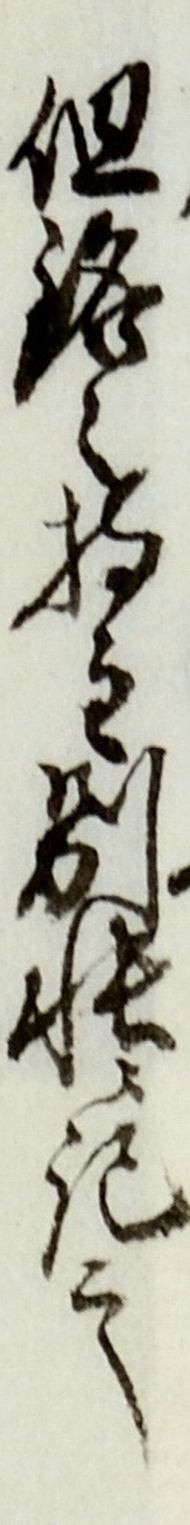但銘々持主別帳ニ記之
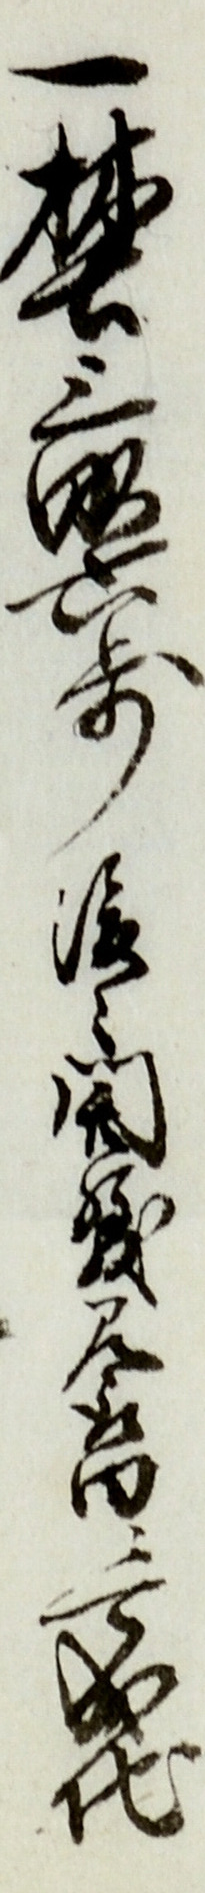一林土三畝六歩後々開発見取田ニ可成地
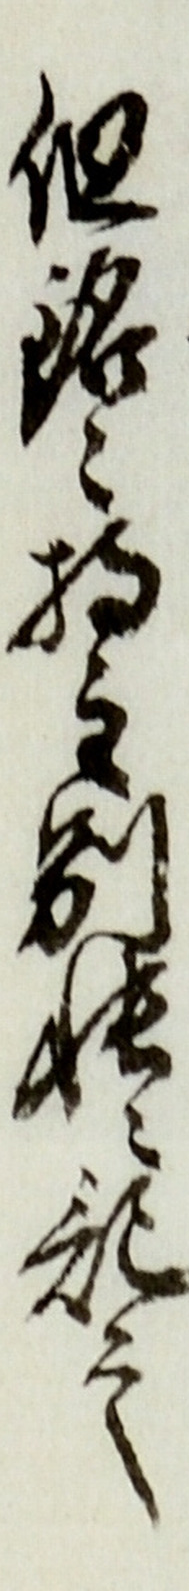但銘々持主別帳ニ記之
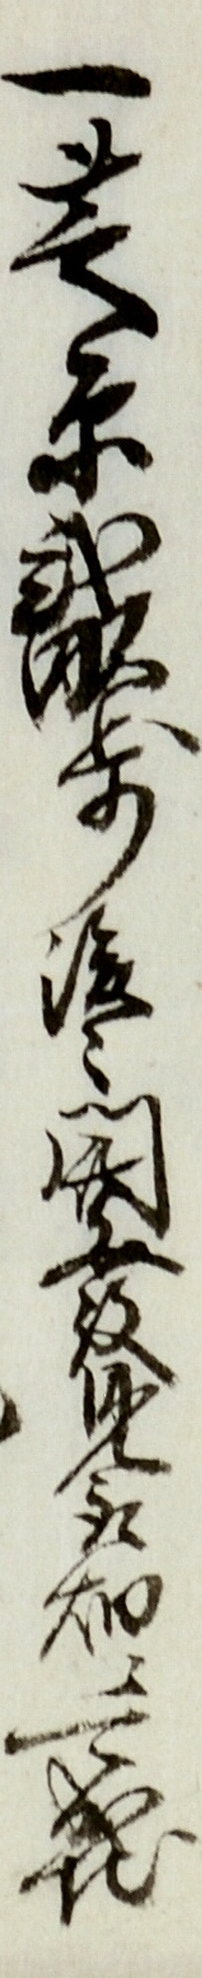一芝原弐畝歩後々開発見取田ニ可成地
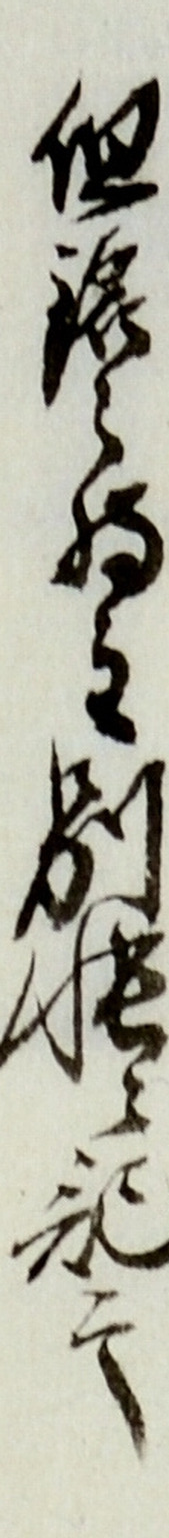但銘々持主別帳ニ記之
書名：御領分中山林社地手控
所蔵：伊那市立高遠町図書館・合同会社AMANE
